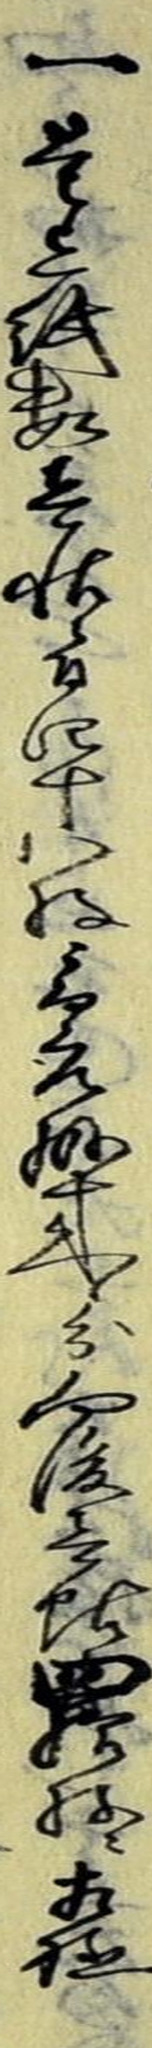一是迄紙数壱帖ニ付四十八枚ニ而取扱来候分向後壱帖四拾枚ニ相極
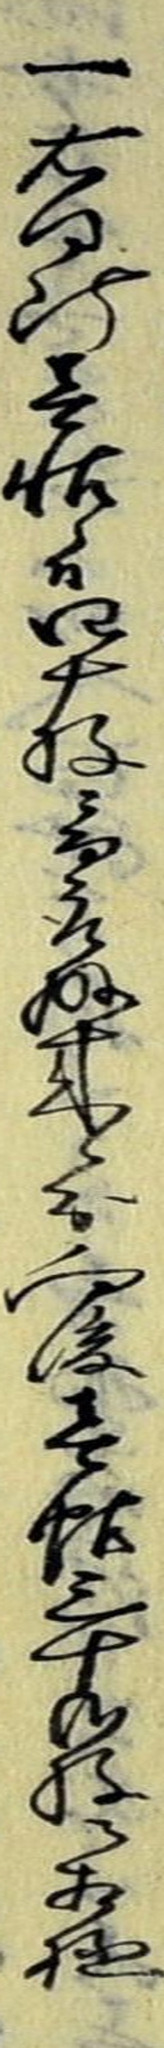一右同断壱帖ニ付四十枚ニ而取扱来候分向後壱帖三十弐枚ニ相極

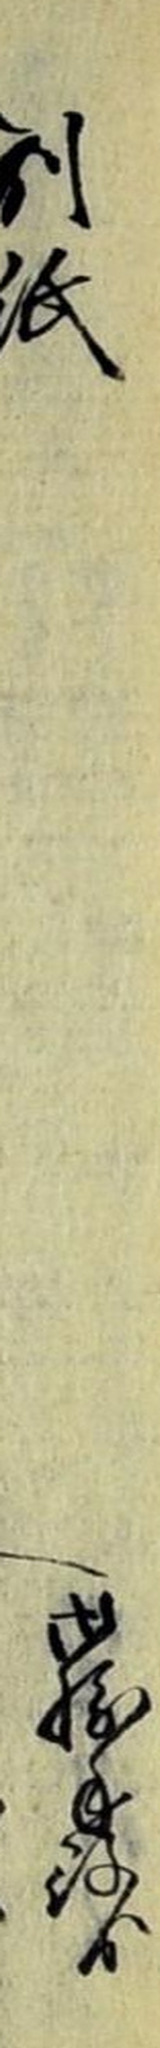別紙御勝手役ゟ
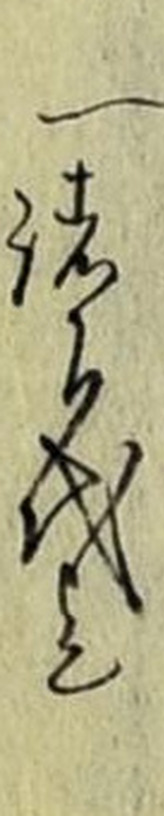諸下代迄
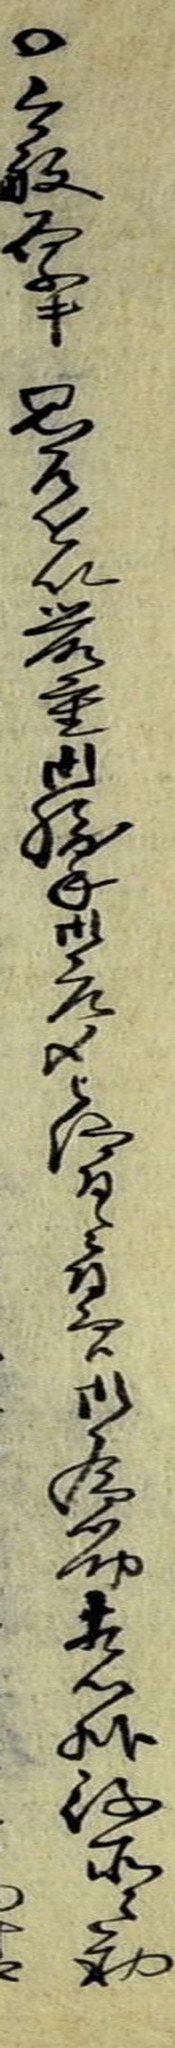〇今般厚キ思召を以厳重御勝手御取〆被仰付候ニ付而ハ御為筋相心掛役所ニ勤
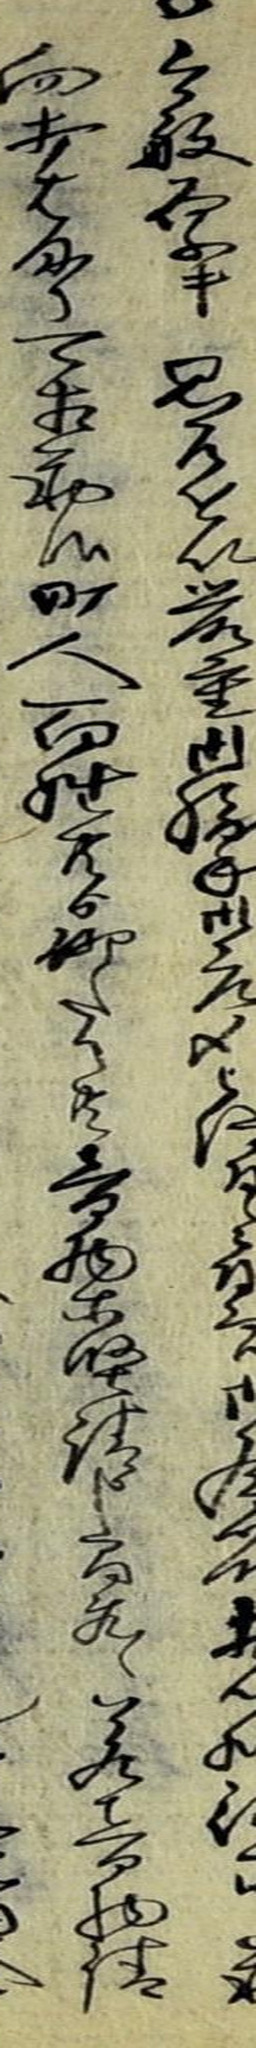向打はまり可相勤候町人百姓共ゟ聊たり共音物等堅請申間敷候若音物請
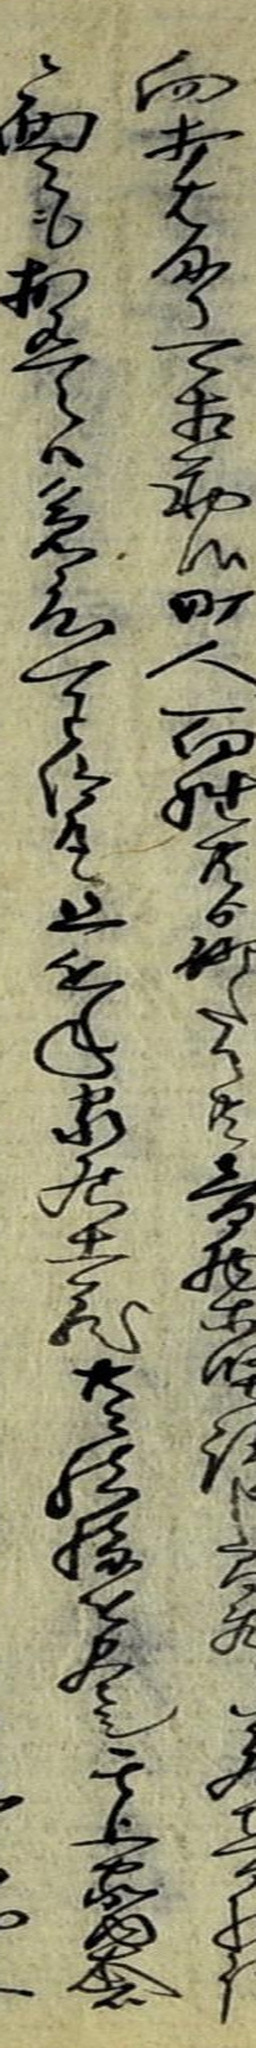候面々も於有之ハ急度可被仰付候且近年家居土蔵共ニ結構を尽シ其上家内奢
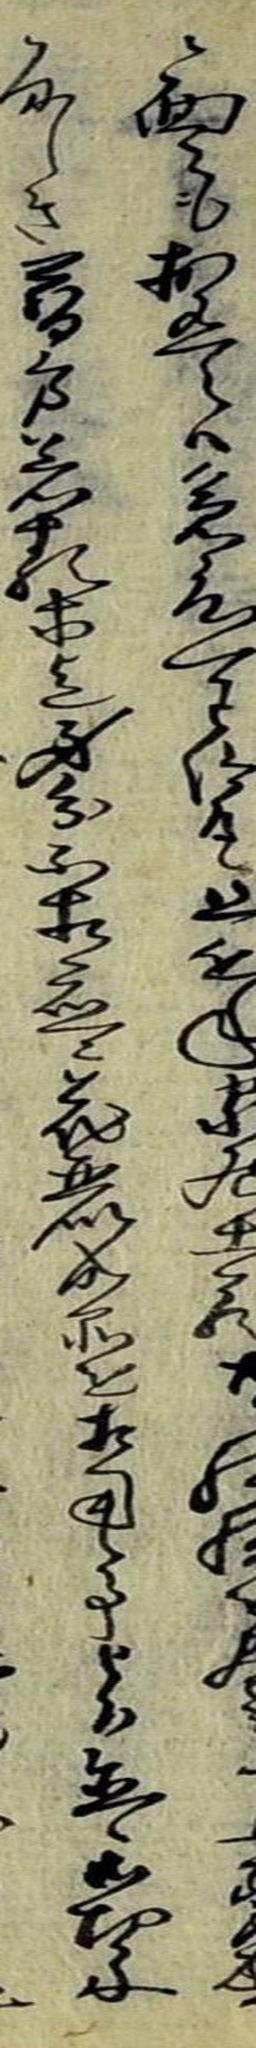かましき暮方着類等迄身分不相応ニ花麗成品を相用候事被下置候御切米
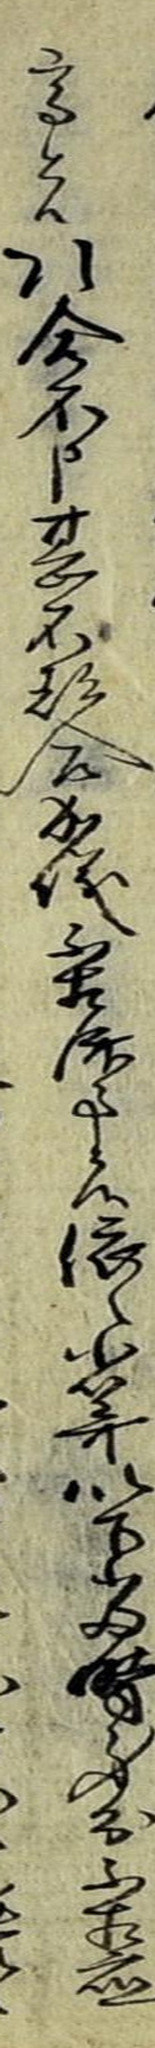高とハ引合不申甚不都合成儀不相済事ニ候依之小算以下当時身分不相応
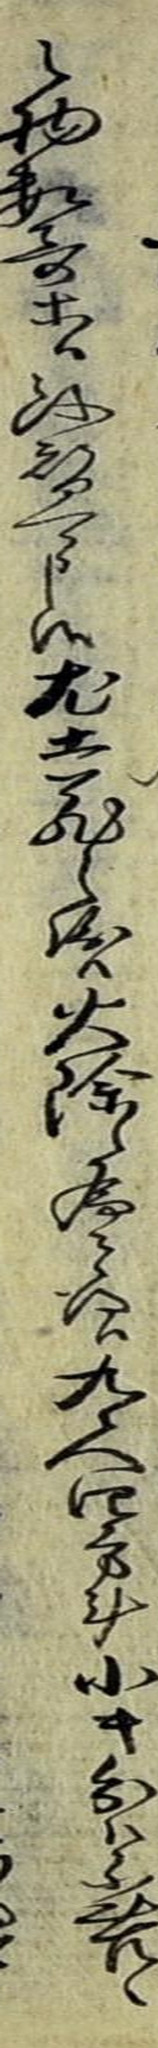之物数奇等ハ致替可申候尤土蔵之儀ハ火除之為ニ候得ハ九尺四方斗小キ分ハ不苦候
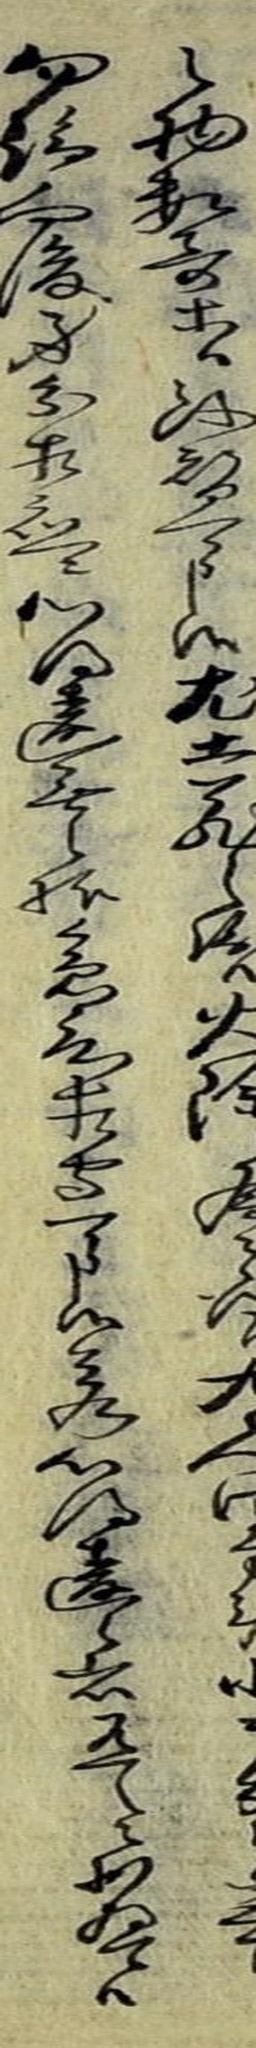勿論向後身分相応ニ心得違無之様急度相守可申候若心得違之者有之ニおゐてハ
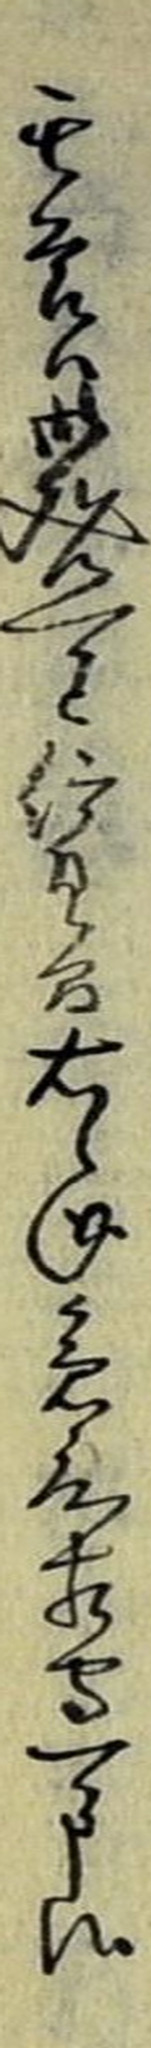其節ハ御咎可被仰付候間右之趣急度相守可申候
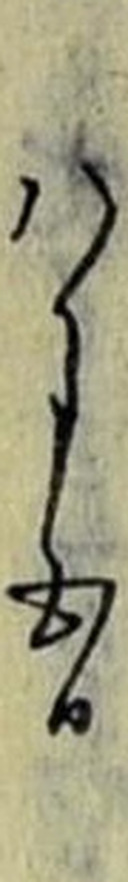八月五日
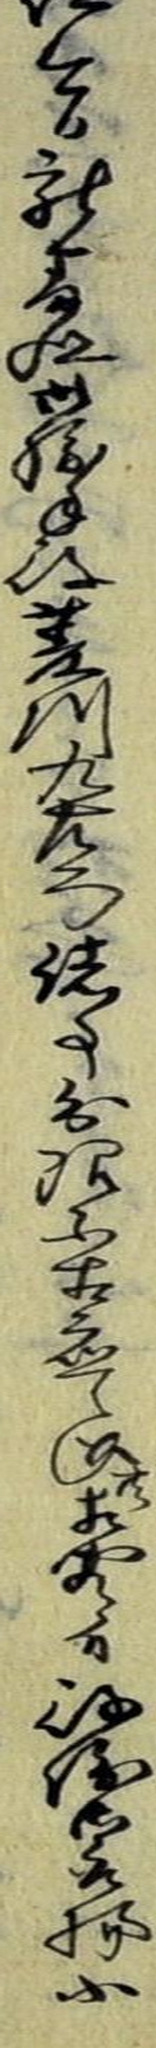但今日新番組御勝手役菱川九左衛門諸事分限不相応之趣共相聞候ニ付役儀御取揚小
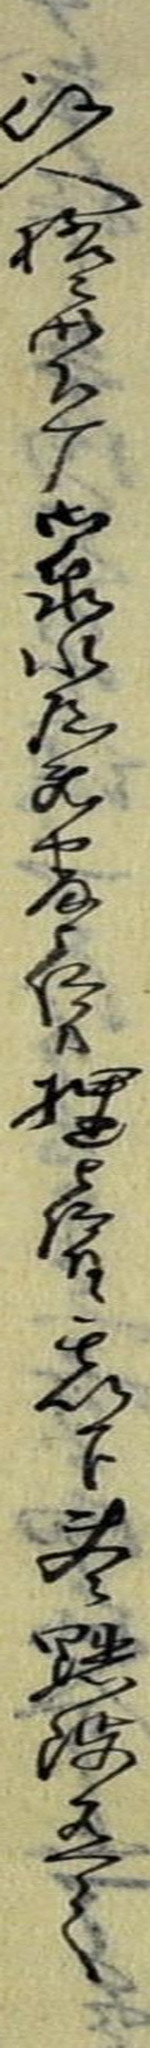役人格ニ御下ケ御泉水屋敷番被仰付押込被仰付候其以下夫々黜陟有之
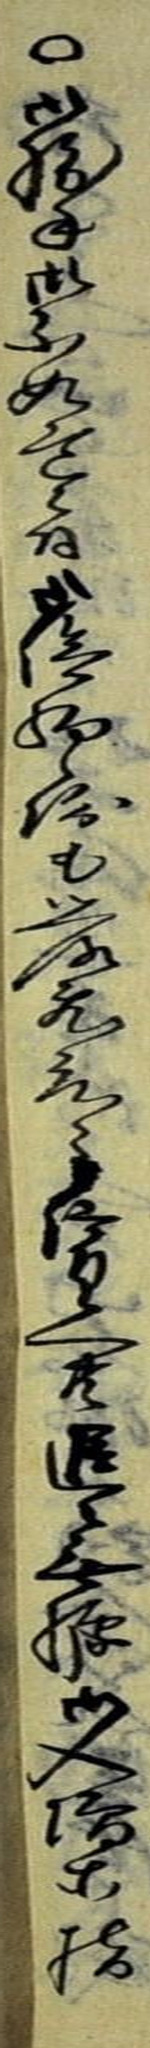〇御勝手御不如意ニ付御倹約之儀も厳敷度々被仰付候へ共追々無拠御入増等指
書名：命令之部 三
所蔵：福井県文書館 Fukui Prefectural Archives
